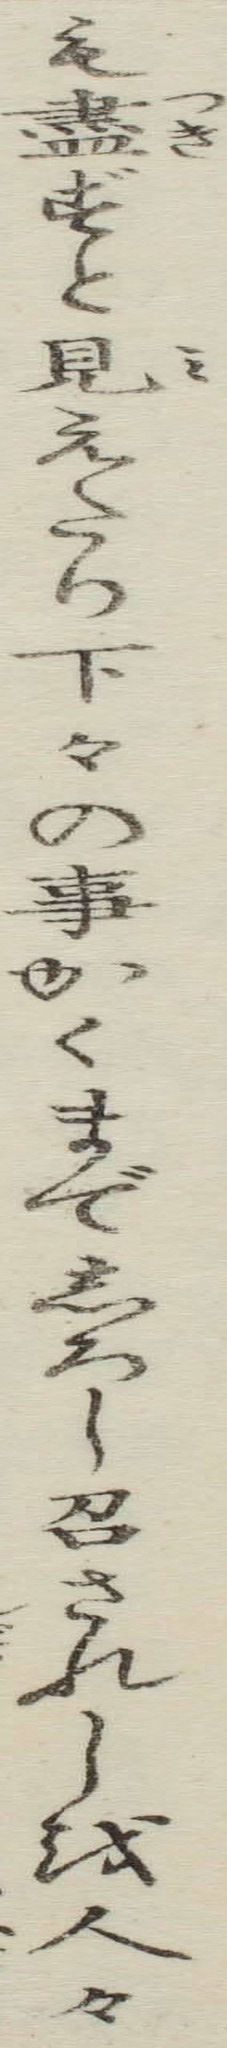も尽ずと見えたり下々の事かくまでしろし召されしを人々
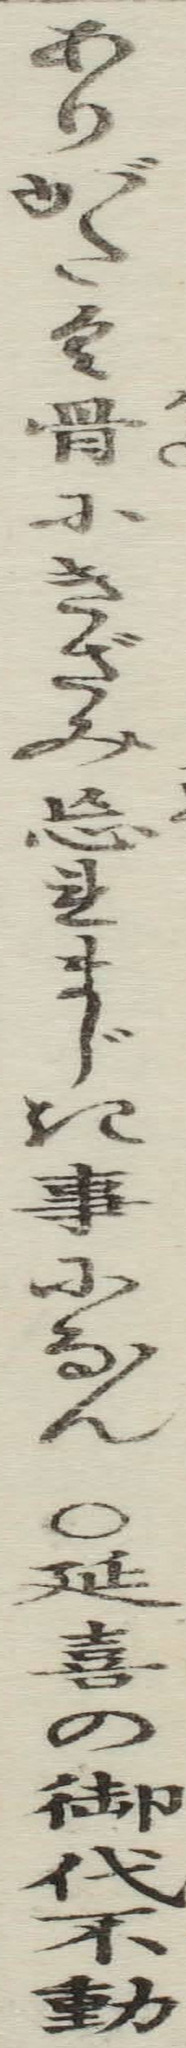ありがたく骨にきざみ忘れまじき事になん○延喜の御代不動
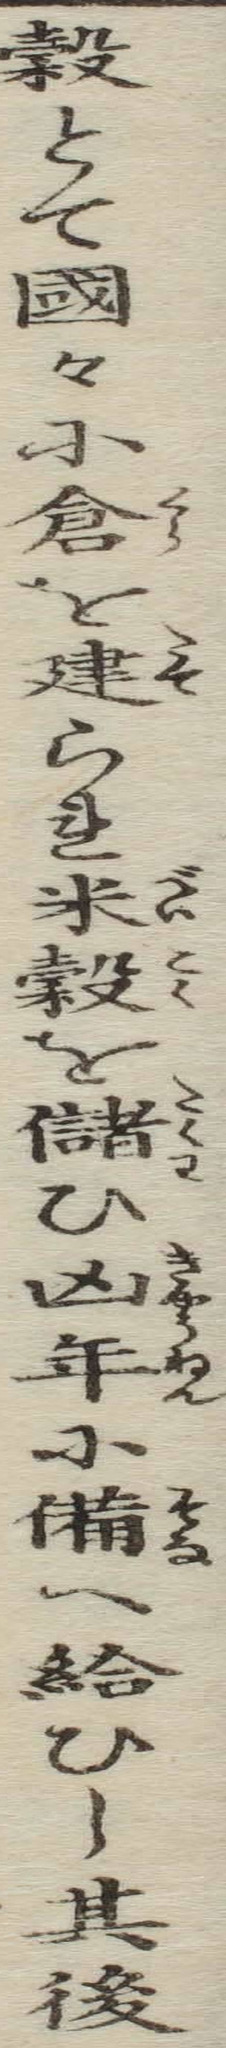穀とて国々に倉を建られ米穀を儲ひ凶年に備へ給ひし其後
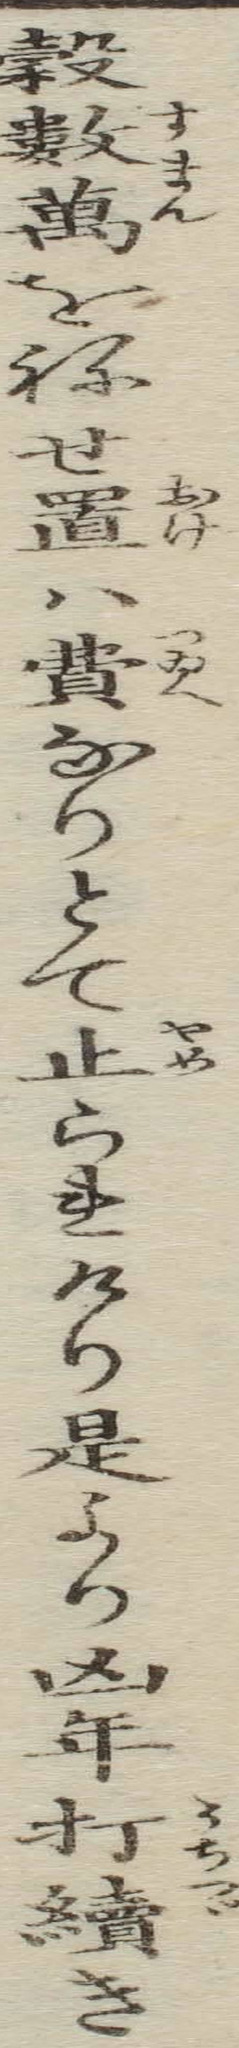穀数万をねせ置は費なりとて止られけり是より凶年打続き
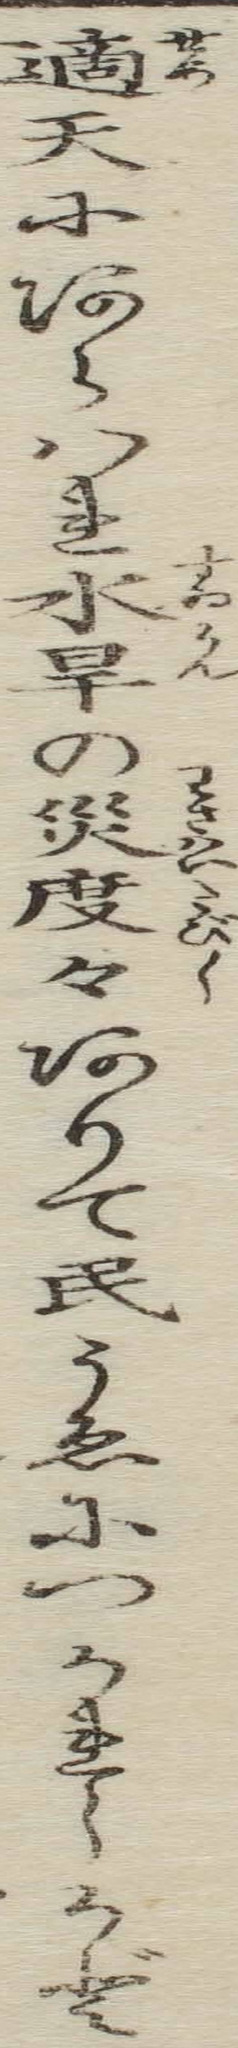適天にあらはれ水旱の災度々ありて民うゑにつかれしかど
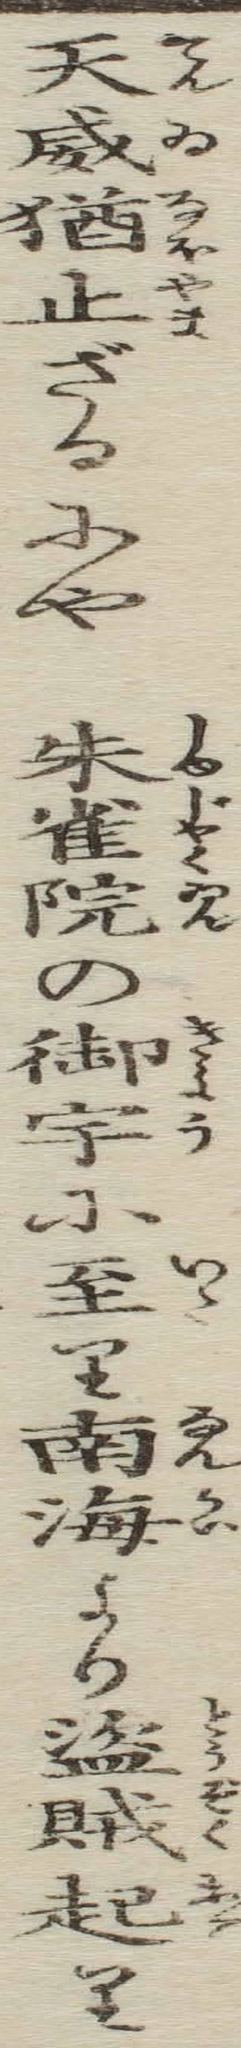天威猶止ざるにや朱雀院の御宇に至り南海より盗賊起り
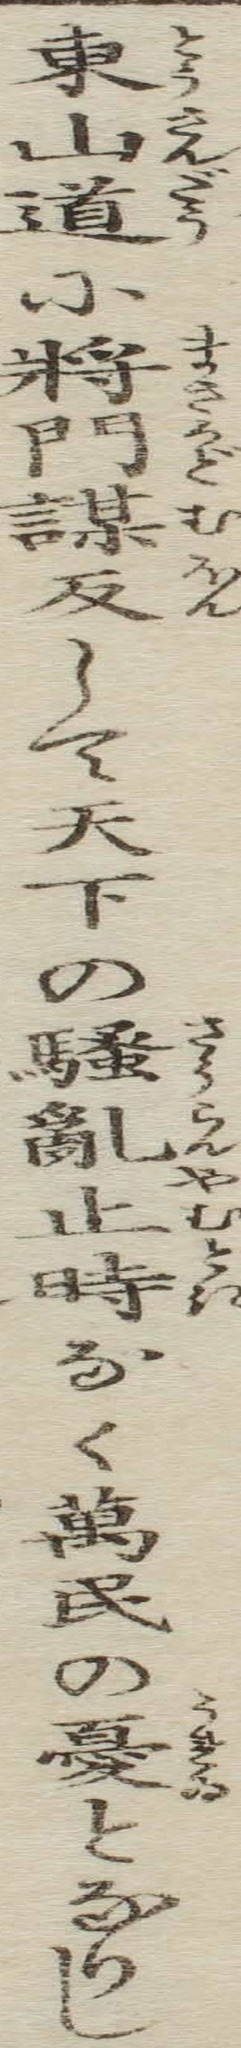東山道に将門謀反して天下の騒乱止時なく万民の憂となりし
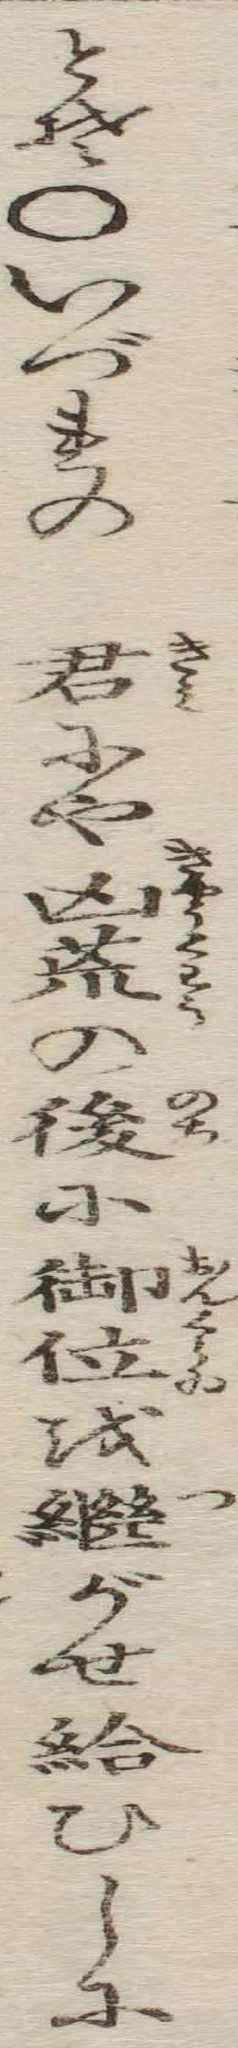とそ○いづれの君にや凶荒の後に御位を継がせ給ひしに
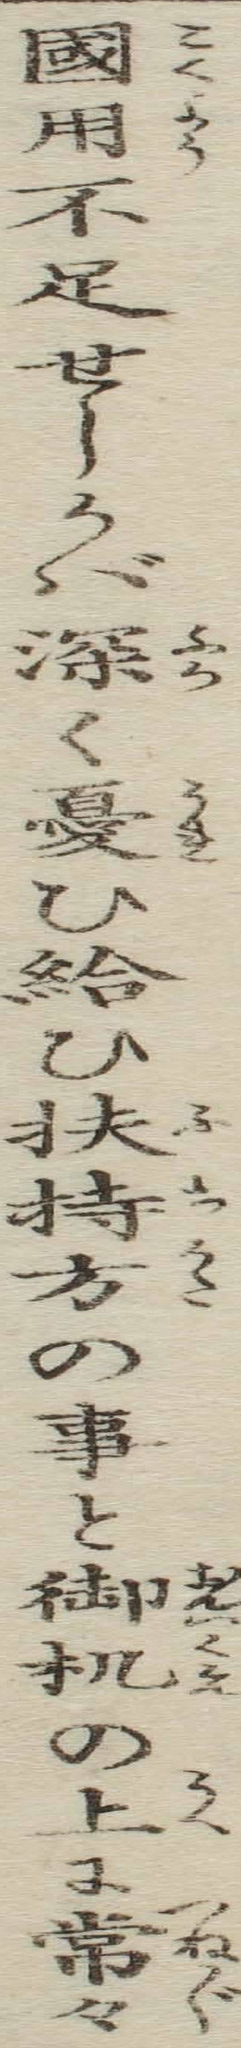国用不足せしかば深く憂ひ給ひ扶持方の事と御机の上に常々
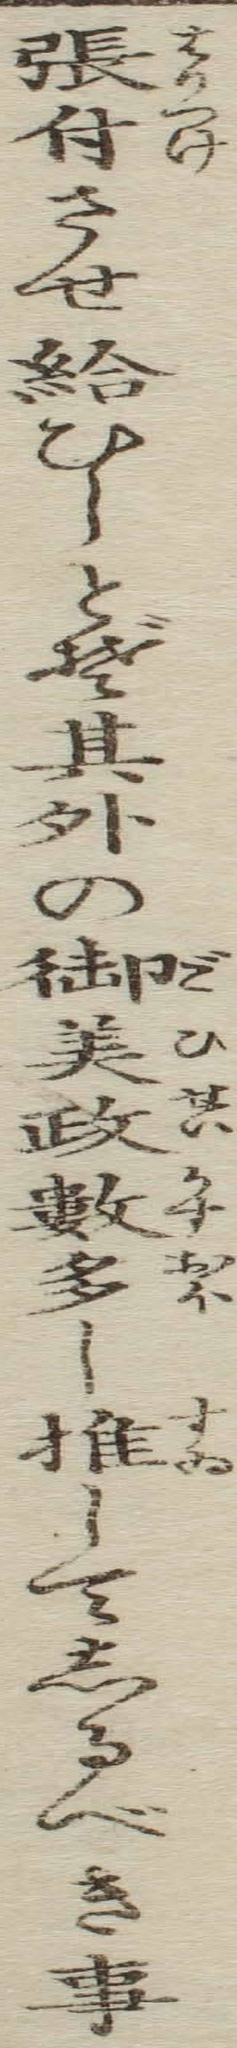張付させ給ひしとぞ其外の御美政数多し推してしるべき事

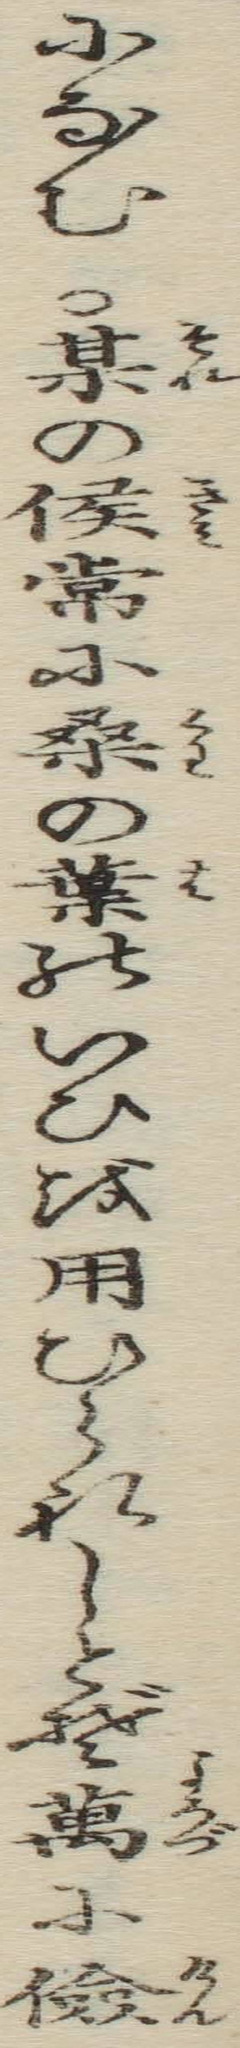になむ○某の侯常に桑の葉のいひを用ひられしとぞ万に倹
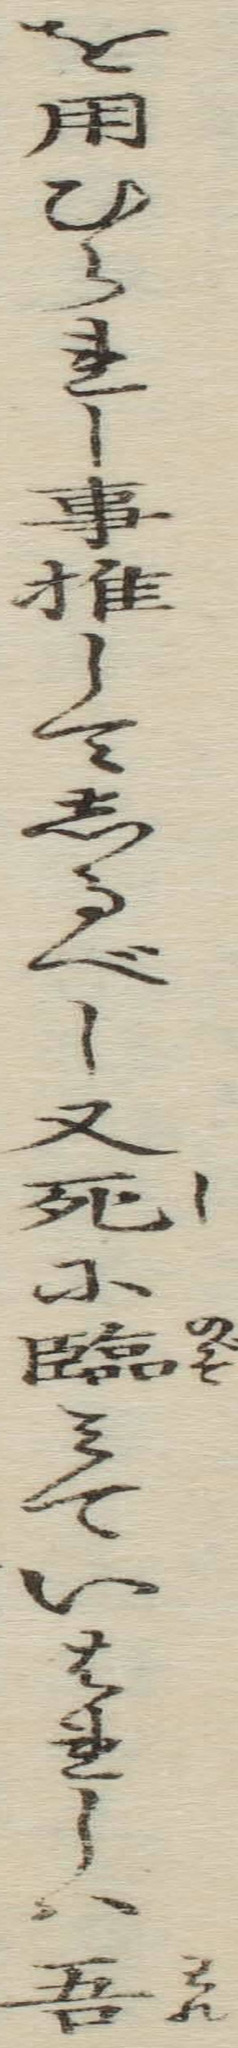を用ひられし事推してしるべし又死に臨みていはれしは吾
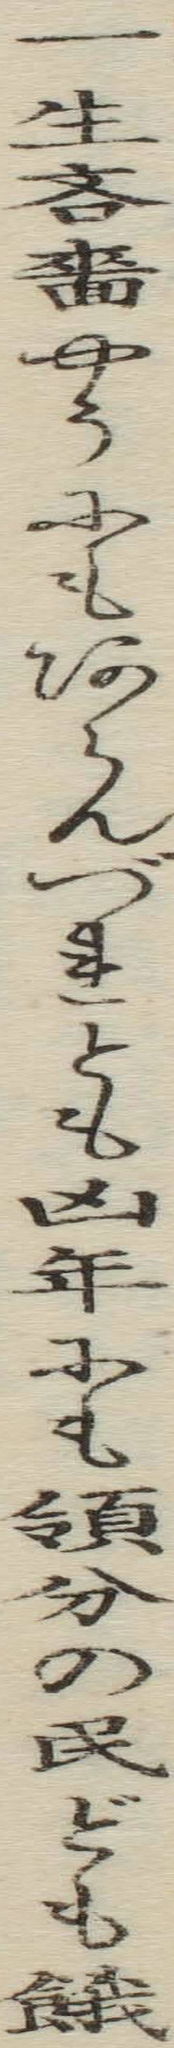一生吝嗇やうにもあらんづれとも凶年にも領分の民ども餓
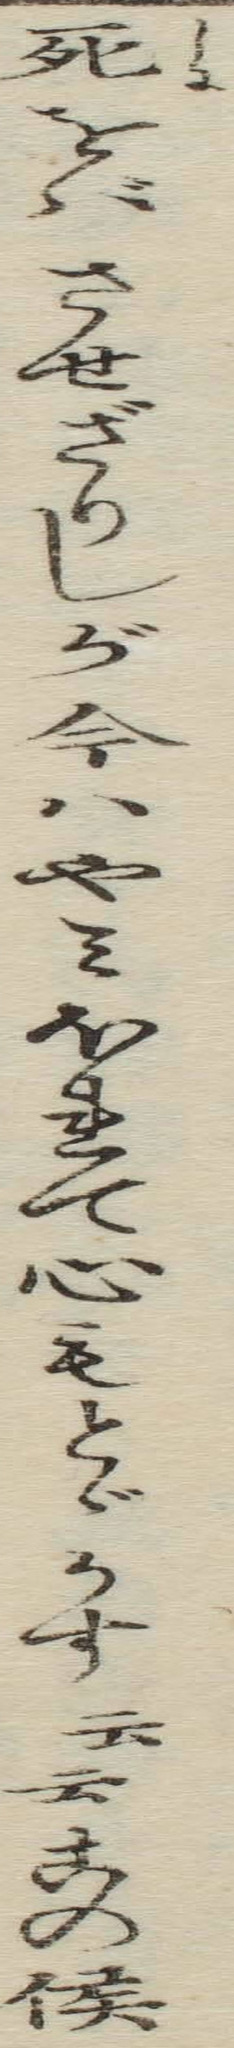死をばさせざりしが今はやみほれて心もとゞかす云云この侯
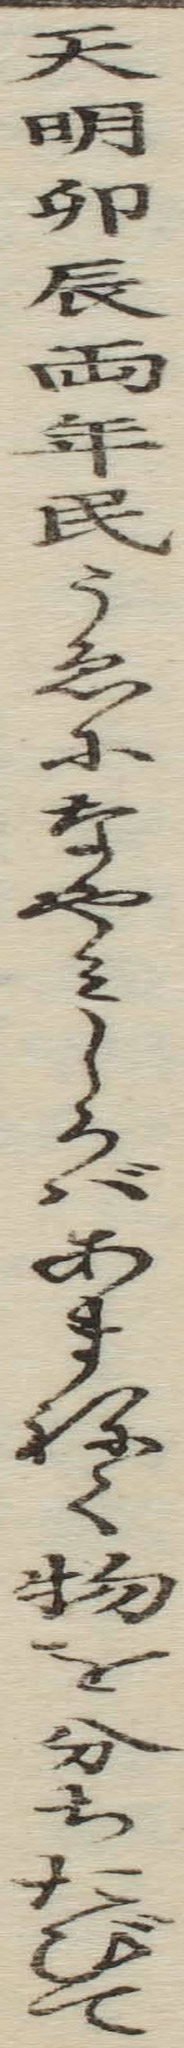天明卯辰両年民うゑになやみしかばあまねく物を分ちたびて
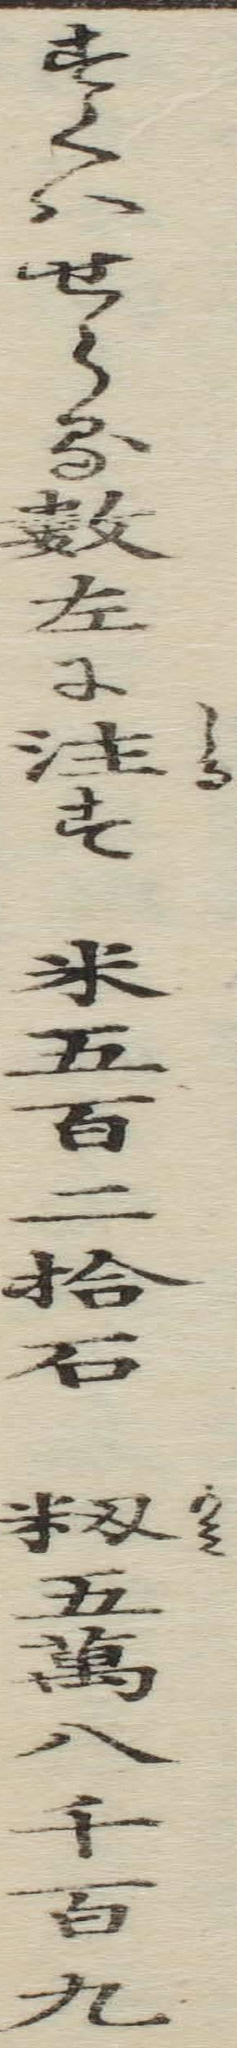すくはせらる数左に注す米五百二拾石籾五万八千百九
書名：救荒便覧
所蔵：国文学研究資料館
